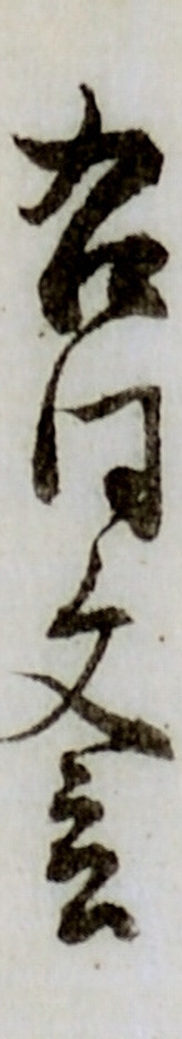右同文言
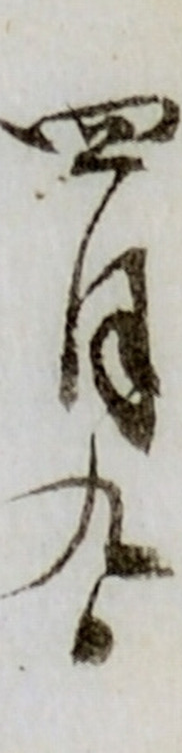四月九日
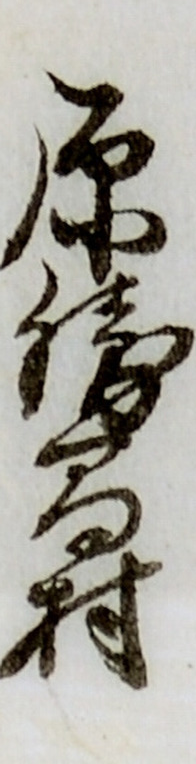原勝間村
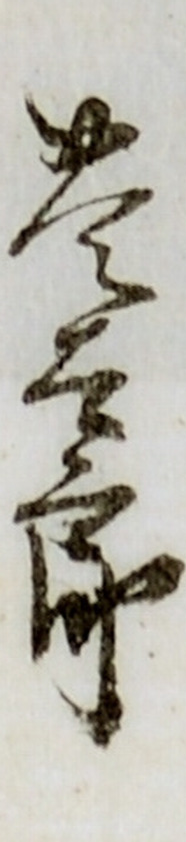豊太郎
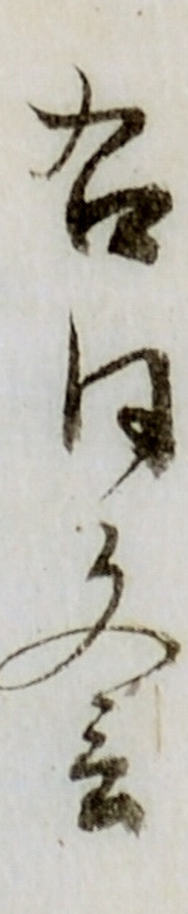右同文言
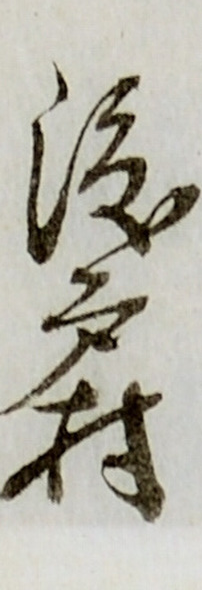渡戸村
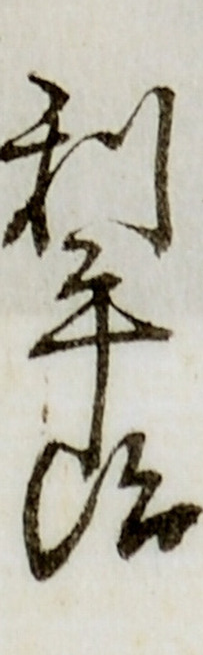利平治
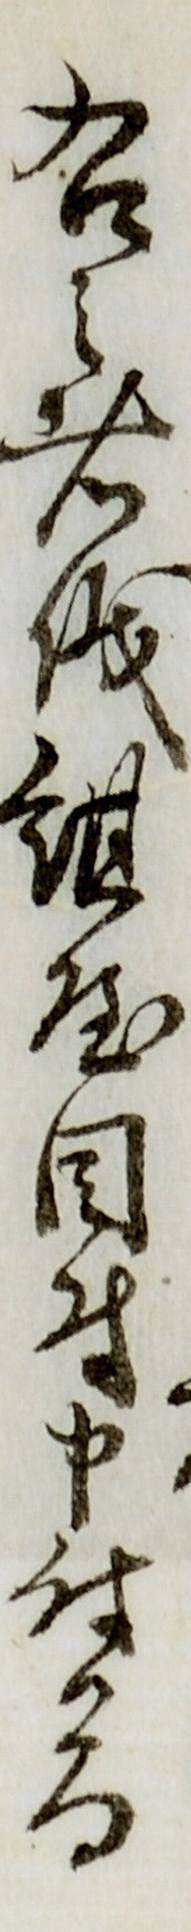右之者儀紺屋目付申付候間
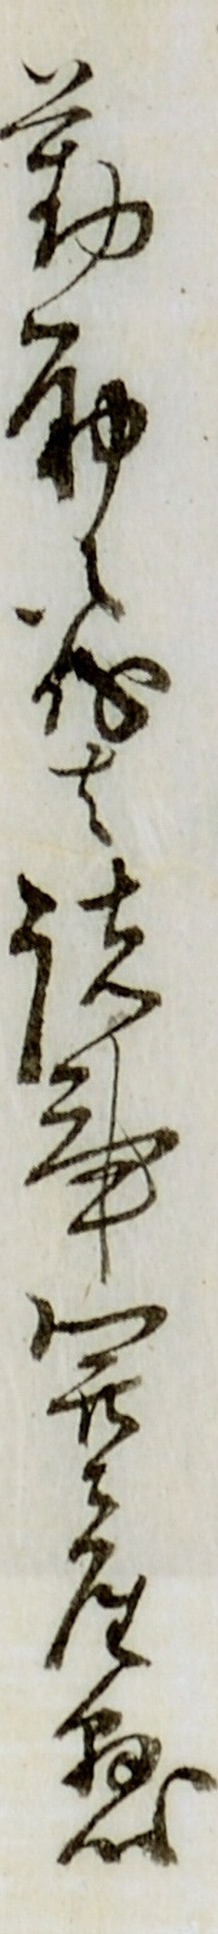勤筋之儀は諸事開産懸
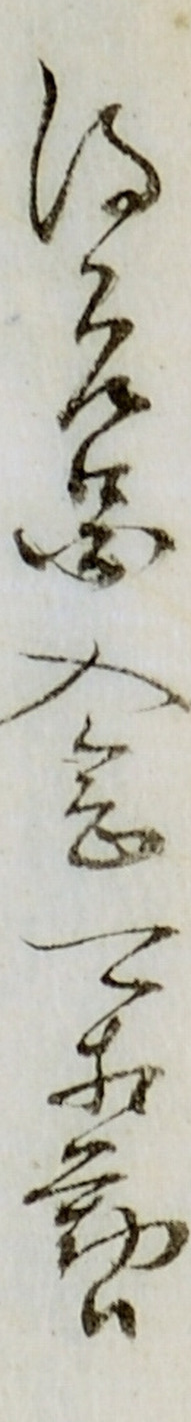得差図入念可相勤候
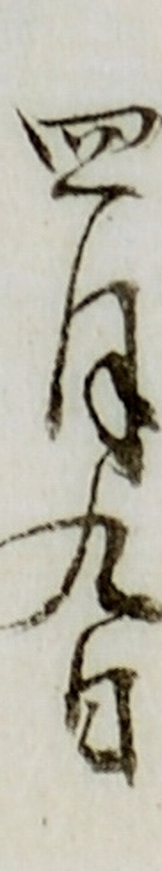四月九日
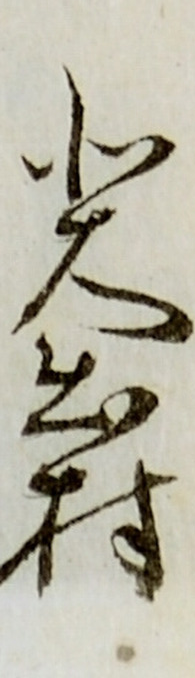北大出村
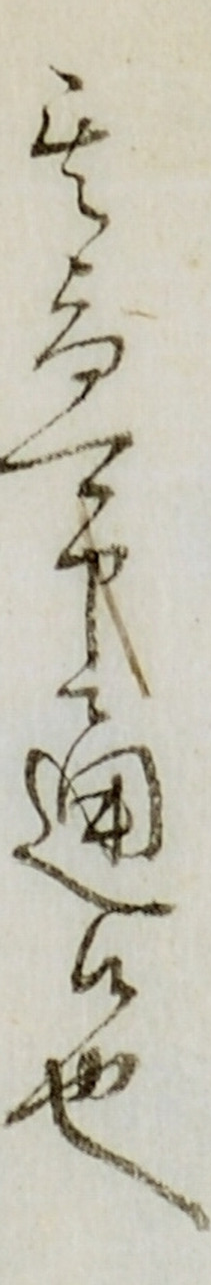其旨可申通候也
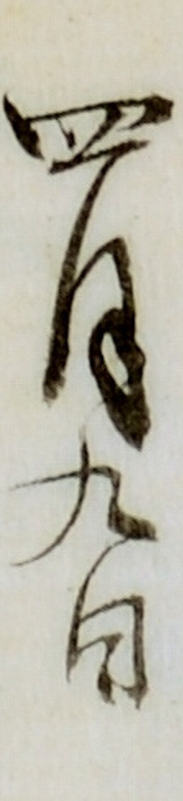四月九日
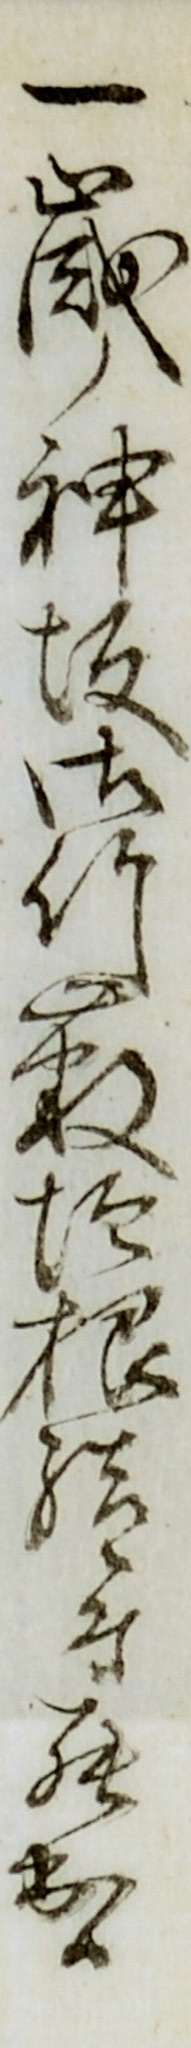一歳ノ神坂御竹藪垣結に付罷出候
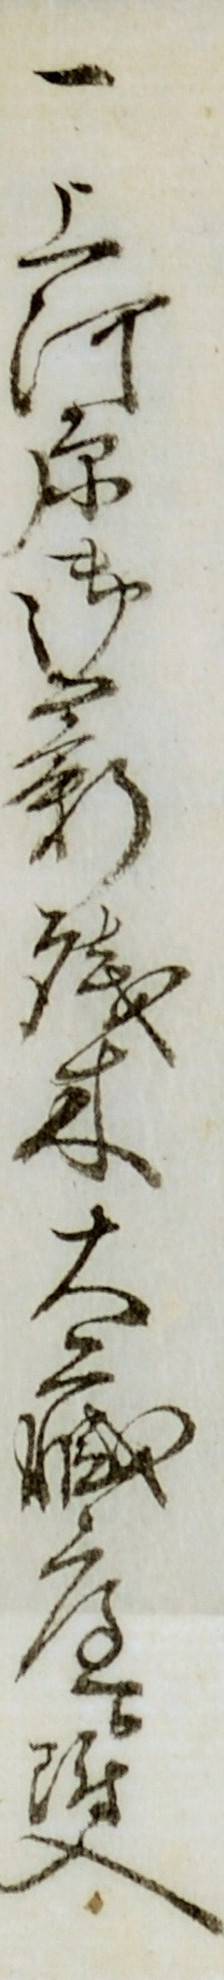一上河原御薪残木大蔵庭え附入
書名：山林方諸事御用留
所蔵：伊那市立高遠町図書館・合同会社AMANE
